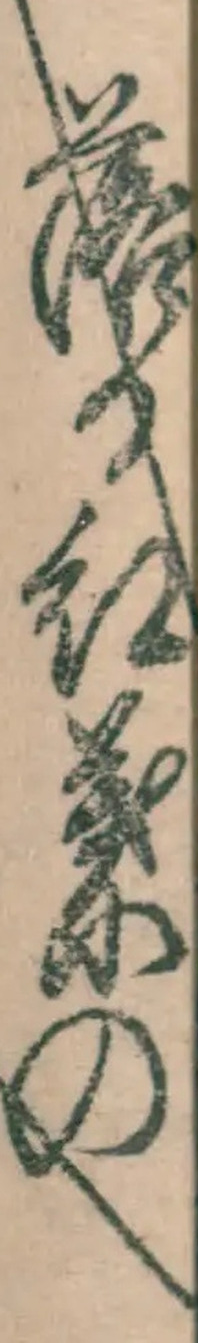落る紅葉の
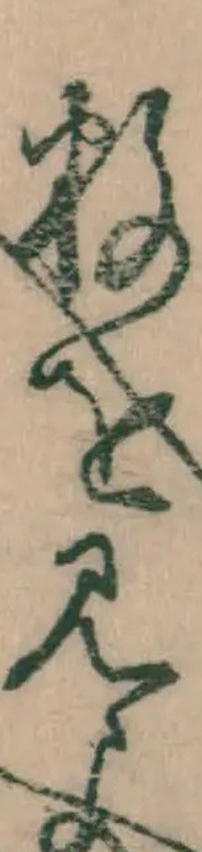数を見よ
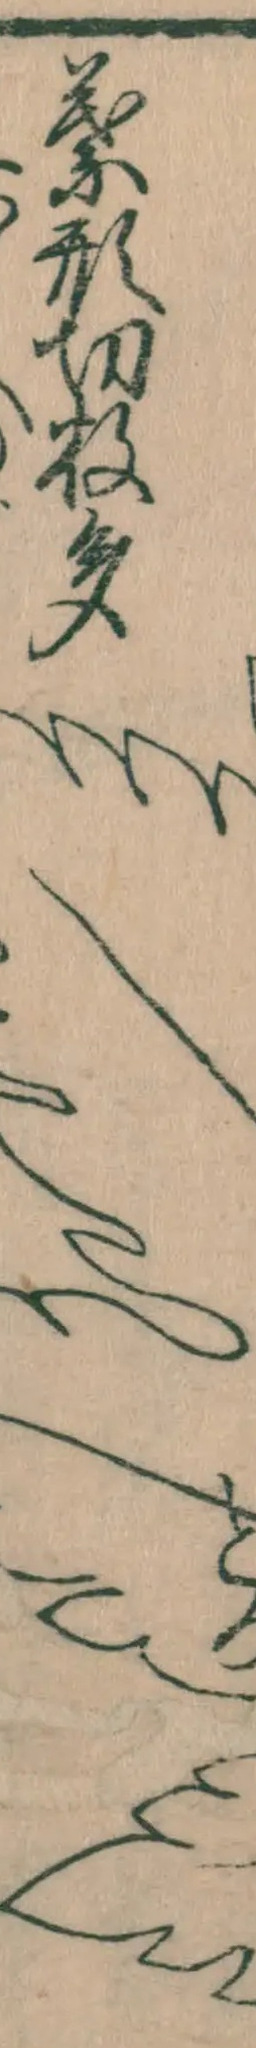葉形切数多
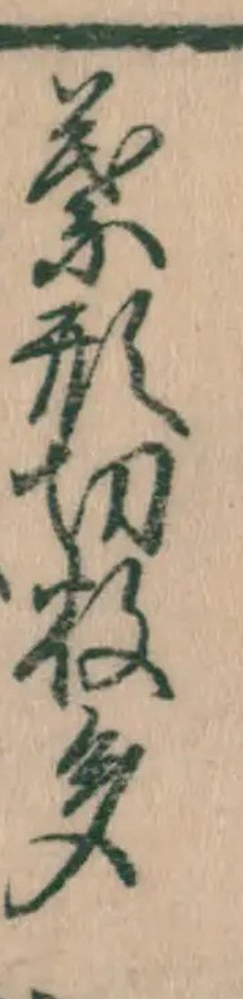葉形切数多
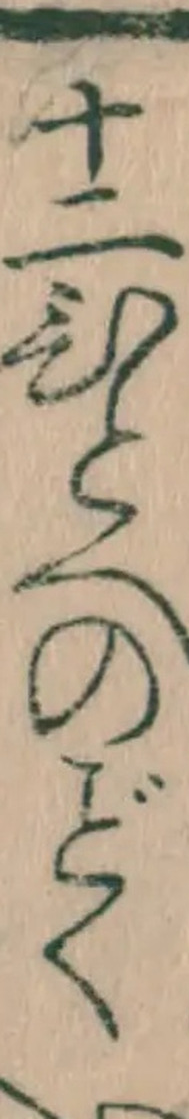十二ひとへのごとく
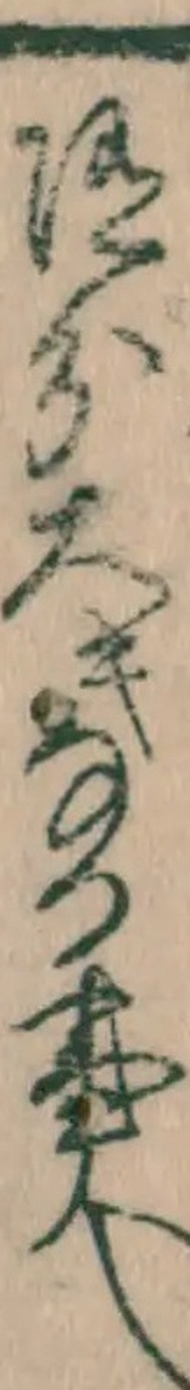随分大キなる事
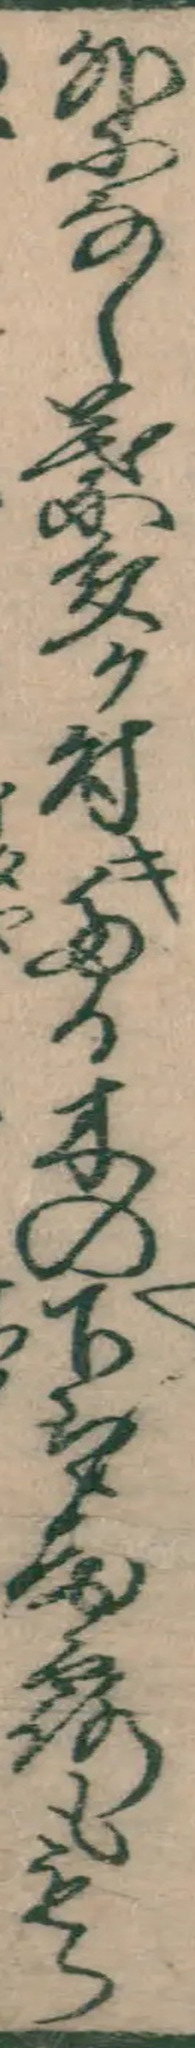外になし葉多ク付キたり木の下は雨露ももら
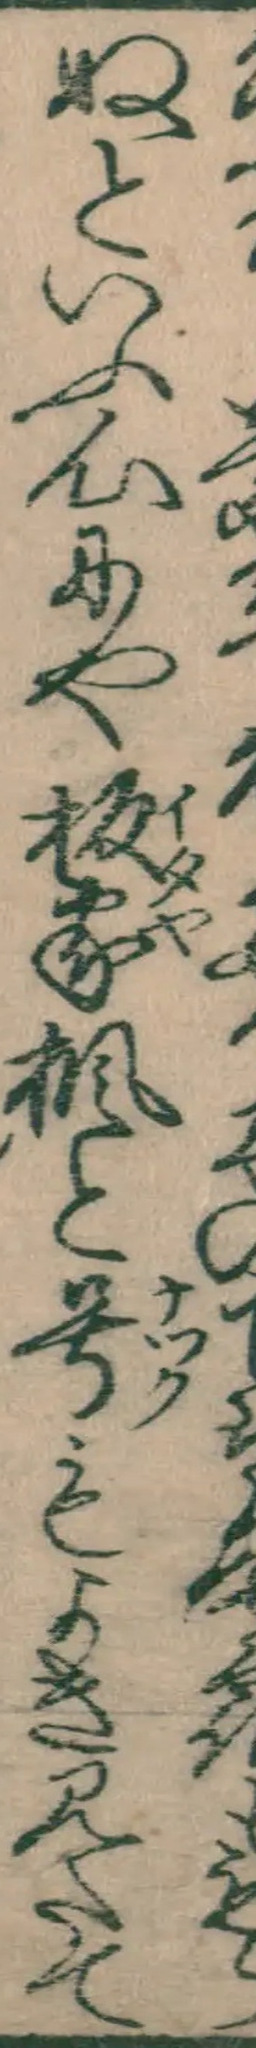ぬといふ心にや板家楓と号もよき見たて
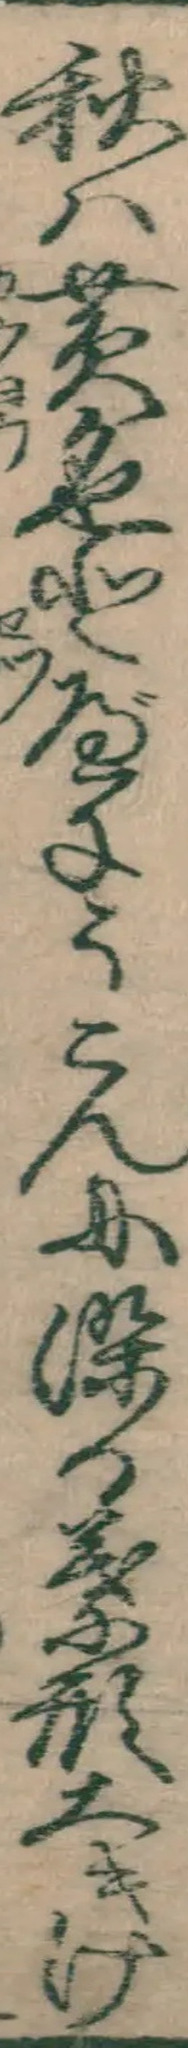秋は黄色とべにうこんに染る葉形大キけ
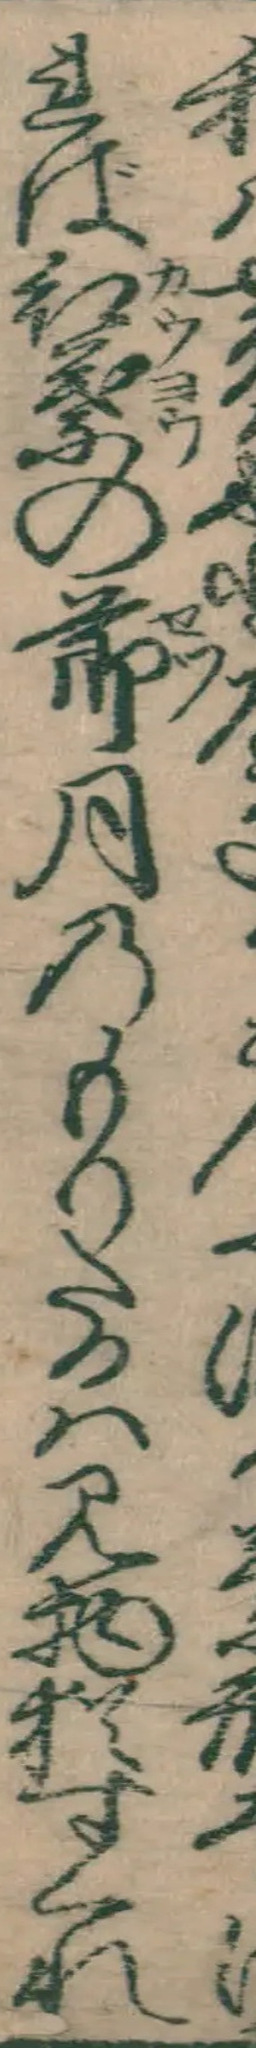れば紅葉の節月のもりたるは見物猶すくれ
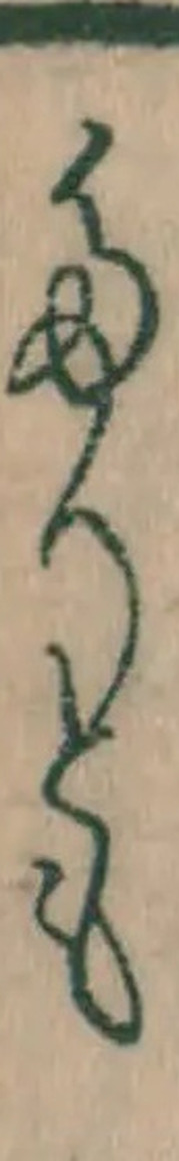たりとも

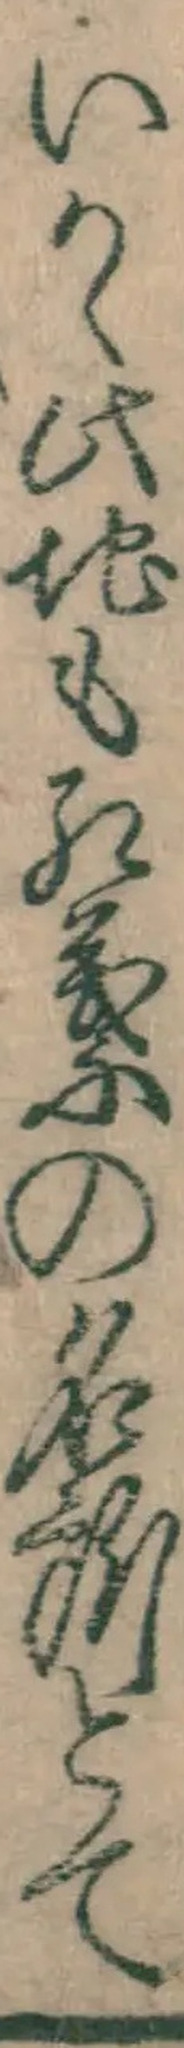いかゝ此地も紅葉の名所とて
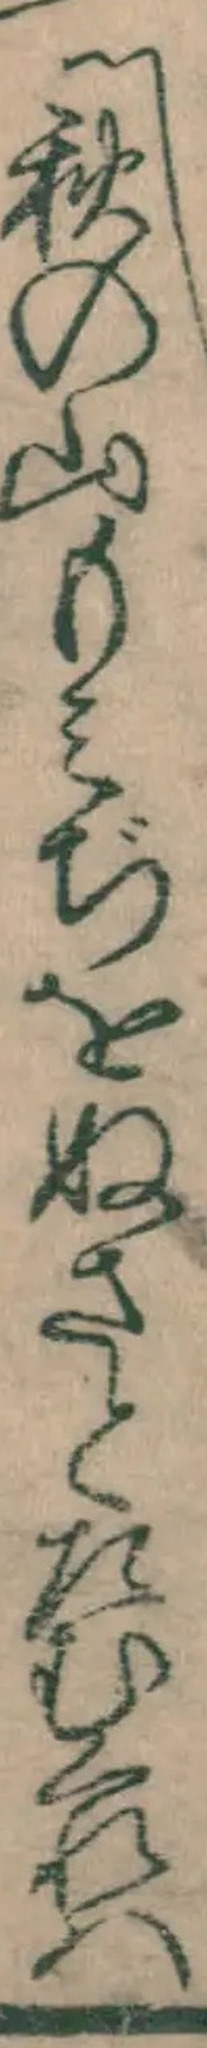〽秋の山もみぢをぬさとたむくれは
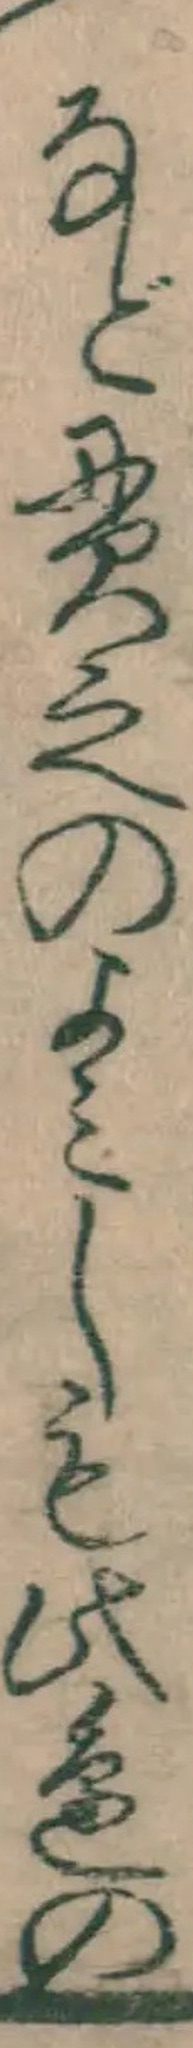など貫之のよみしも此辺の
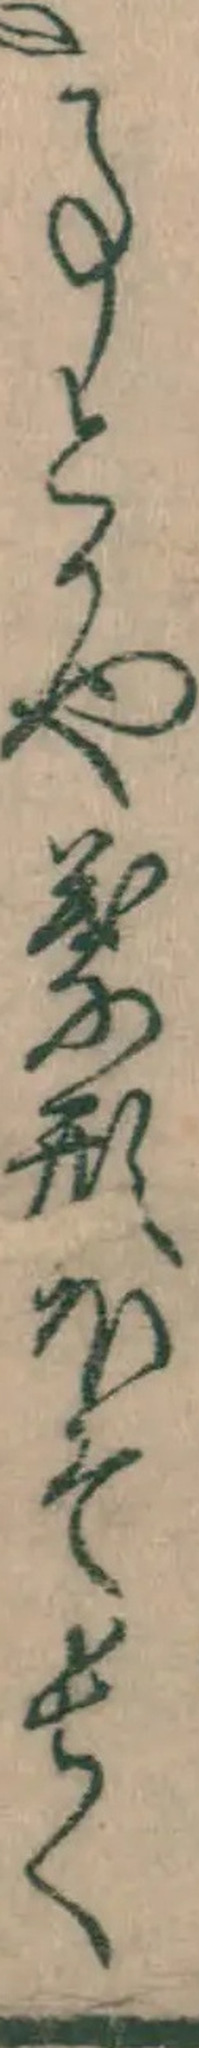事とかや葉形ほそ長く
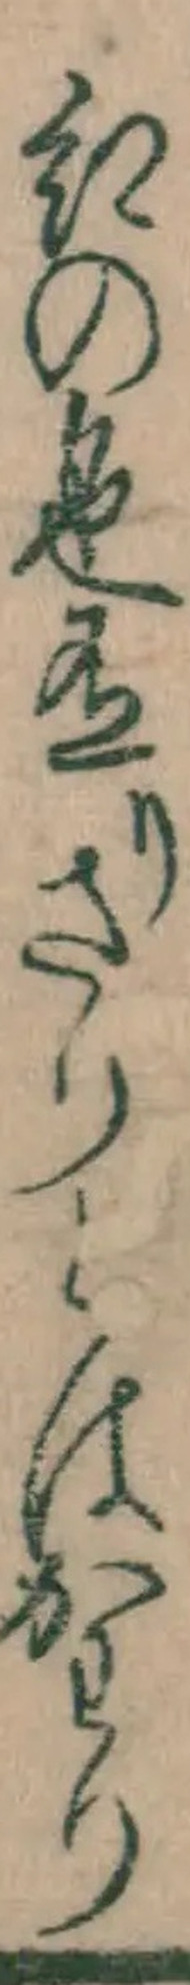紅の色有りさりとはかわり
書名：紅葉集
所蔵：国立国会図書館 National Diet Library, JAPAN
